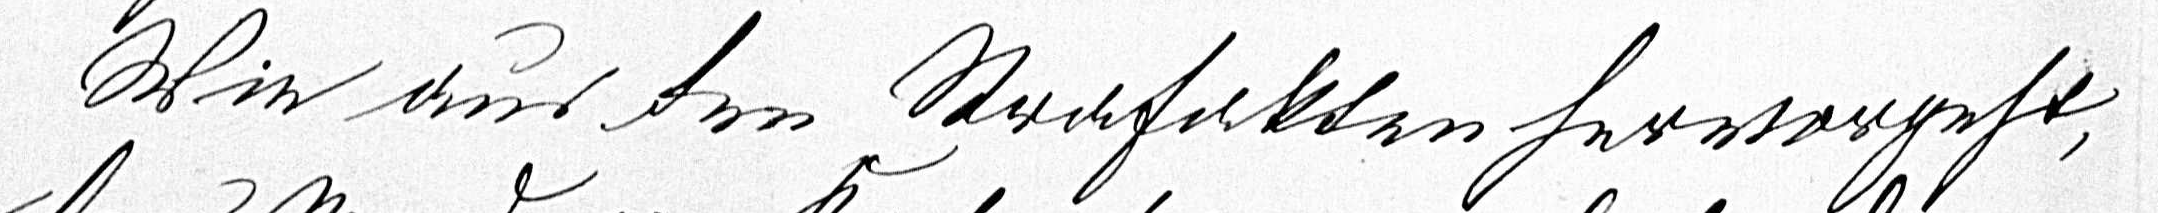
Wie aus den Strafakten hervorgeht,
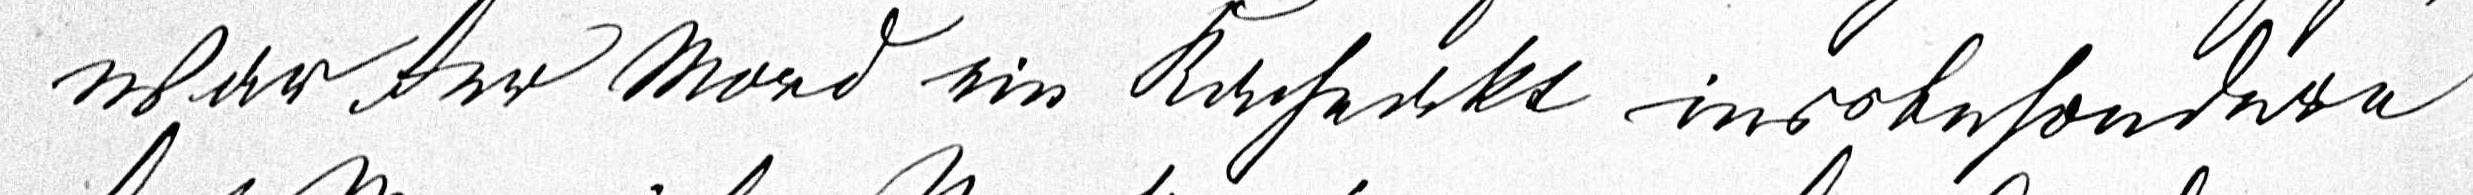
war der Mord ein Rachenkt insbesondere
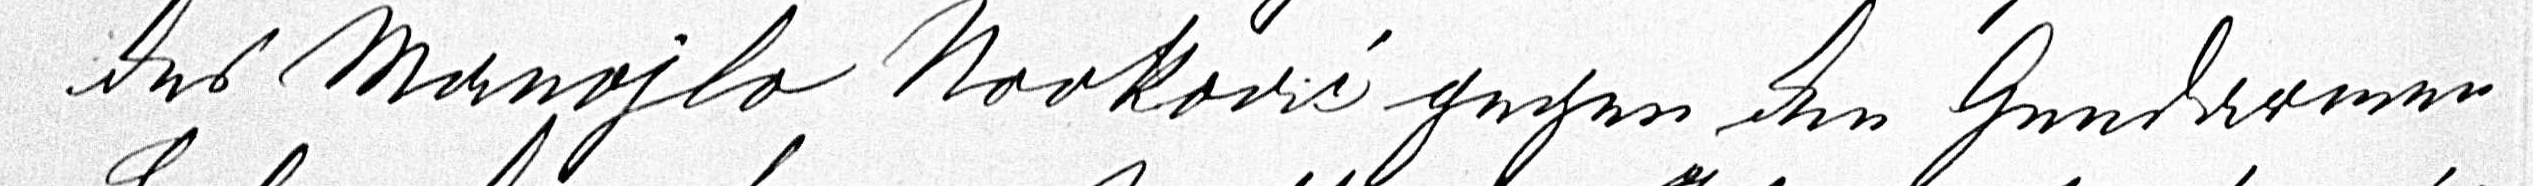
des Manojlo Novković gegen den Gendarmen
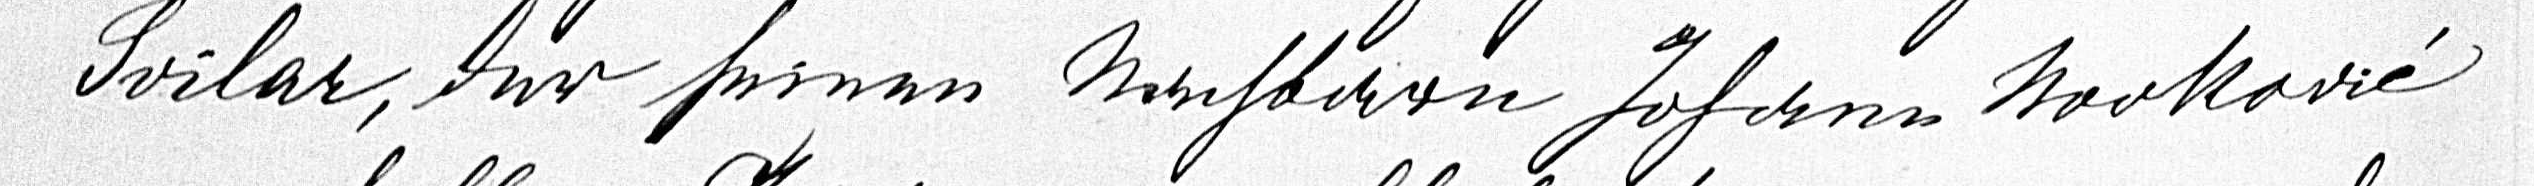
Svilar, der seinen Nachbarn Johann Novković
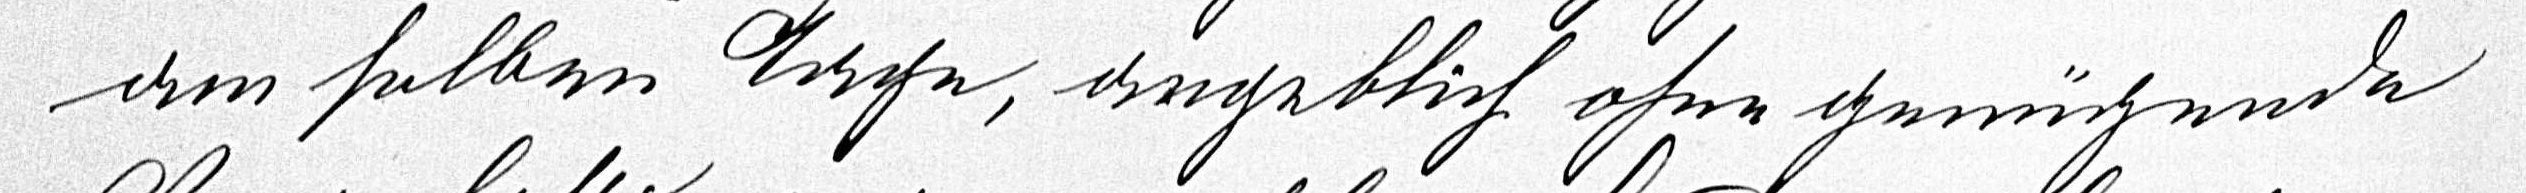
am selben Tage, angeblich ohne genügende
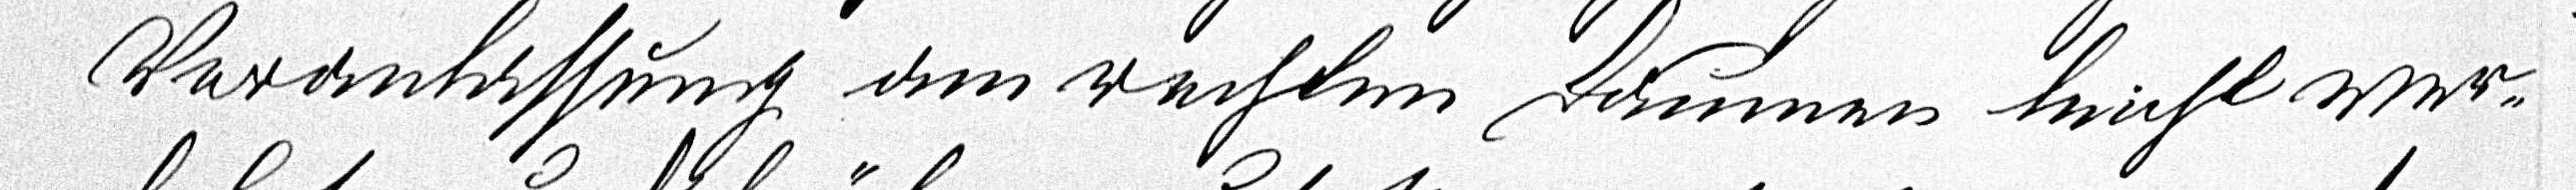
Veranlassung am rechten Daumen leicht ver¬
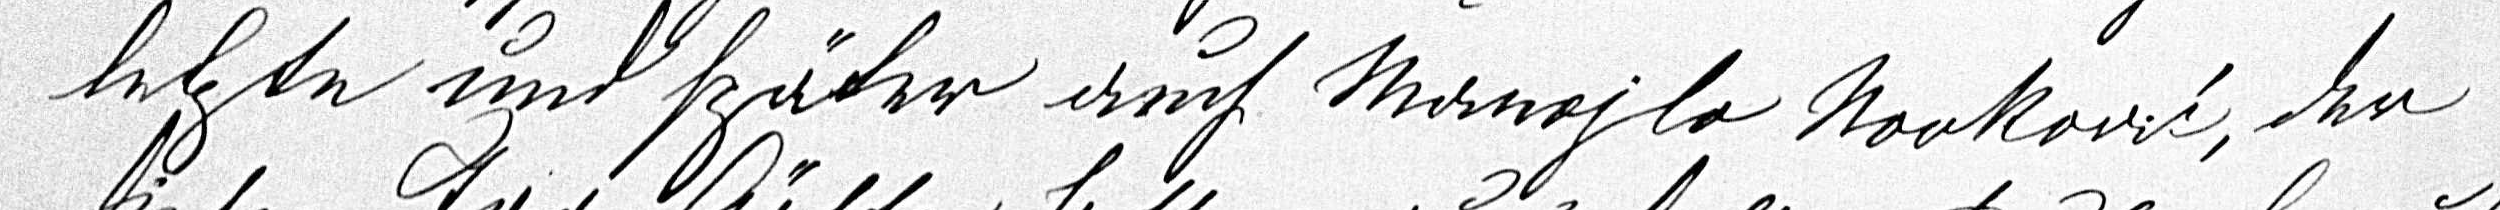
letzte und später auch Manojlo Novković, der
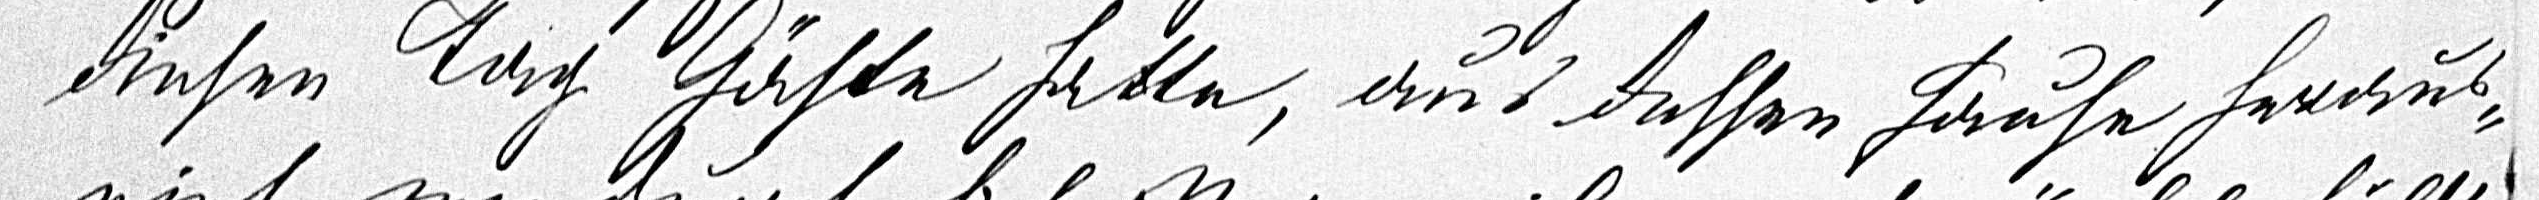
diesen Tag Gäste hatte, aus dessen Hause herau¬
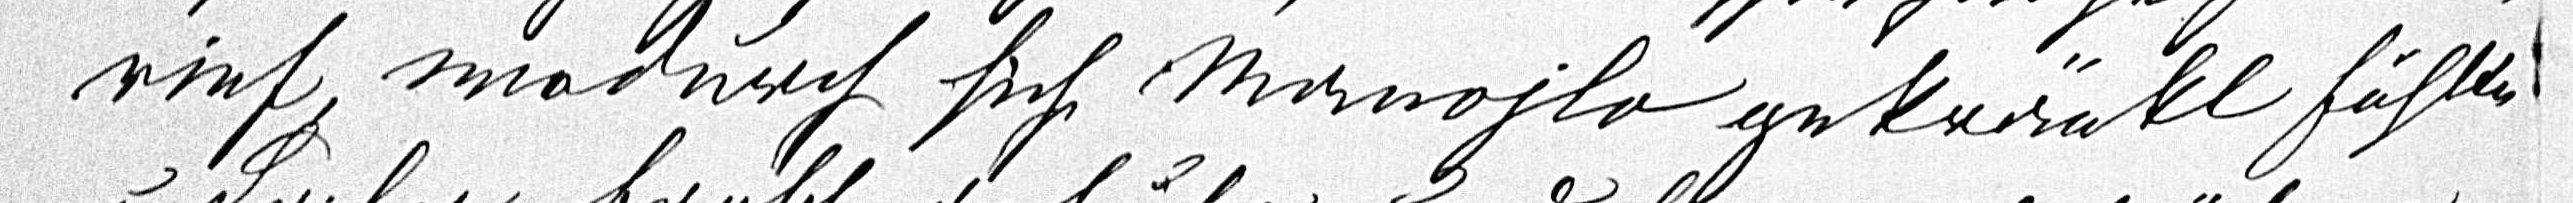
srief, wodurch sich Manojlo gekränkt Fühlte
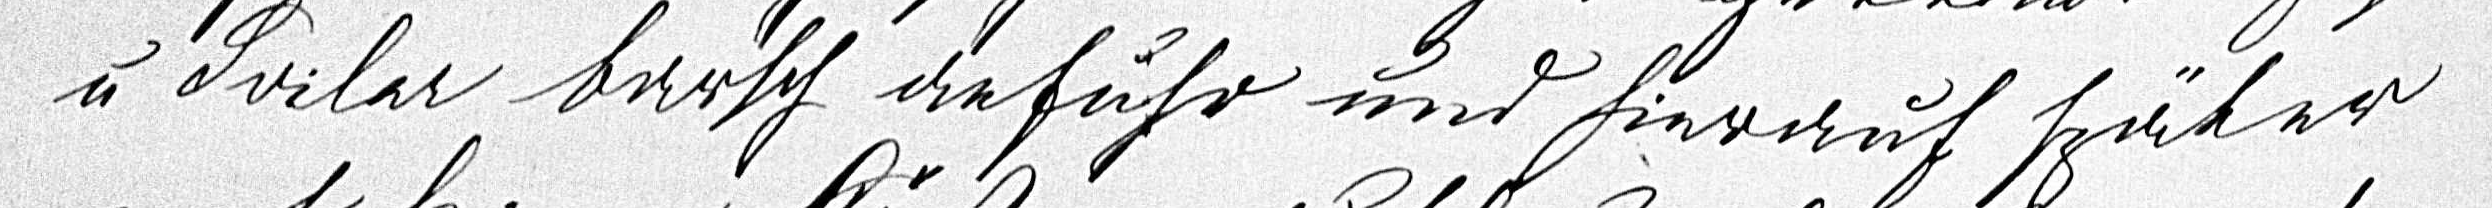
u Svilar barsch anfuhr und hierauf später
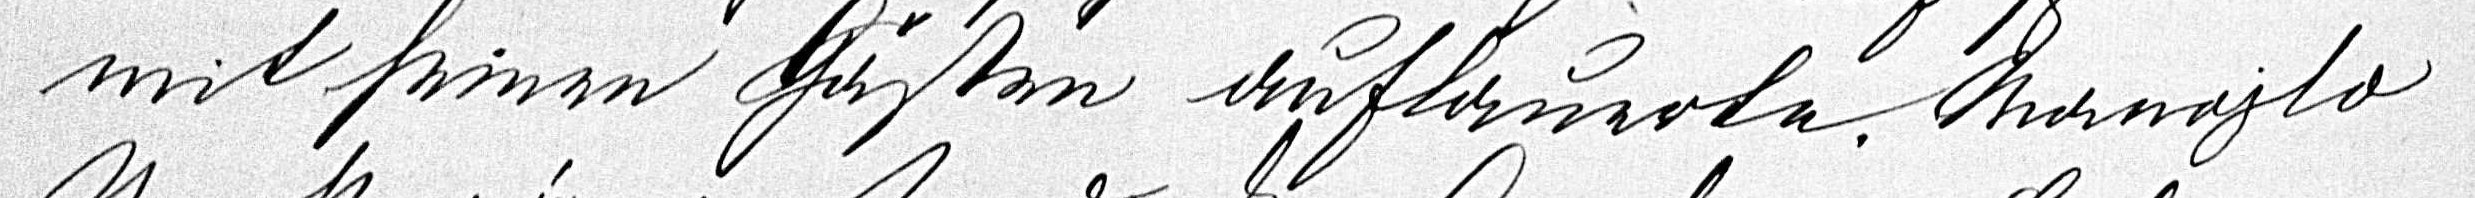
mit seinen Gästen auflauerte. Manojlo
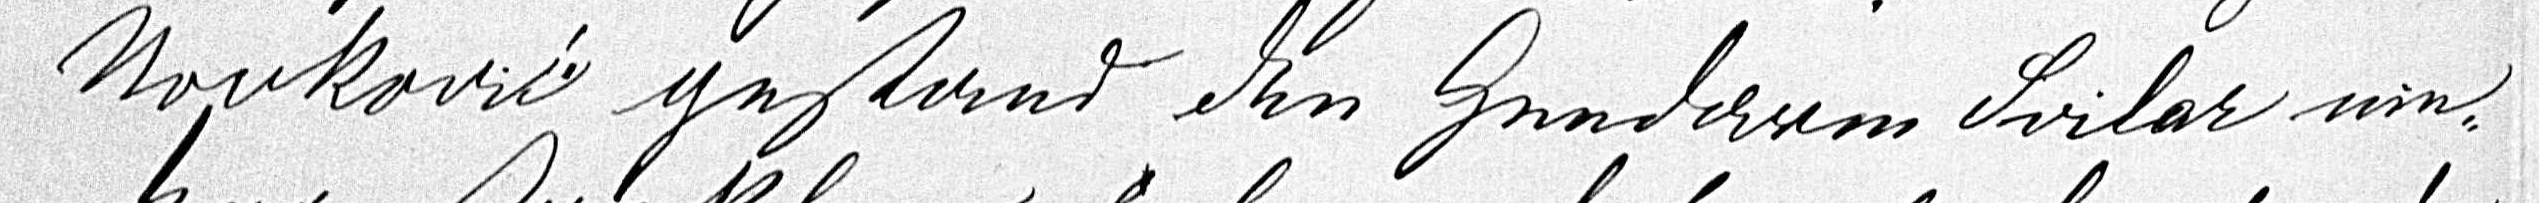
Novković gestand den Gendarm Svilar nie¬
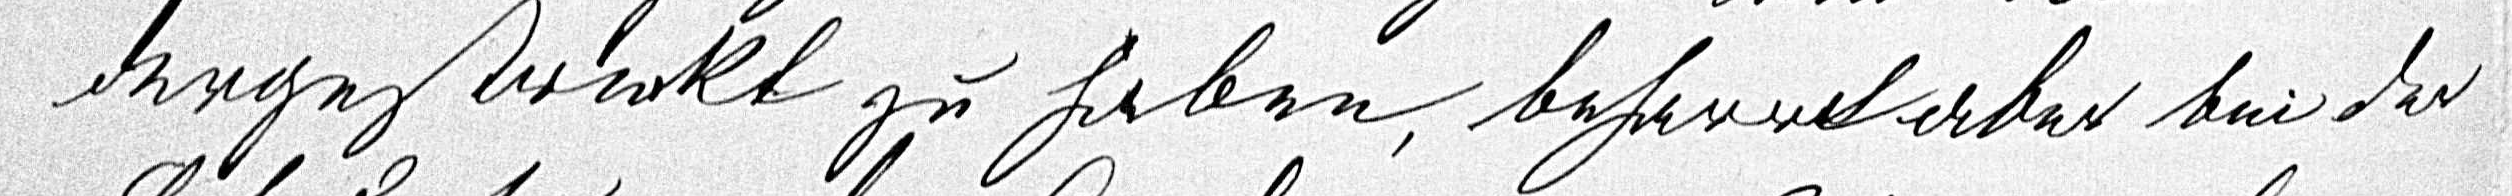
dergestreckt zu haben, beharrt aber bei der
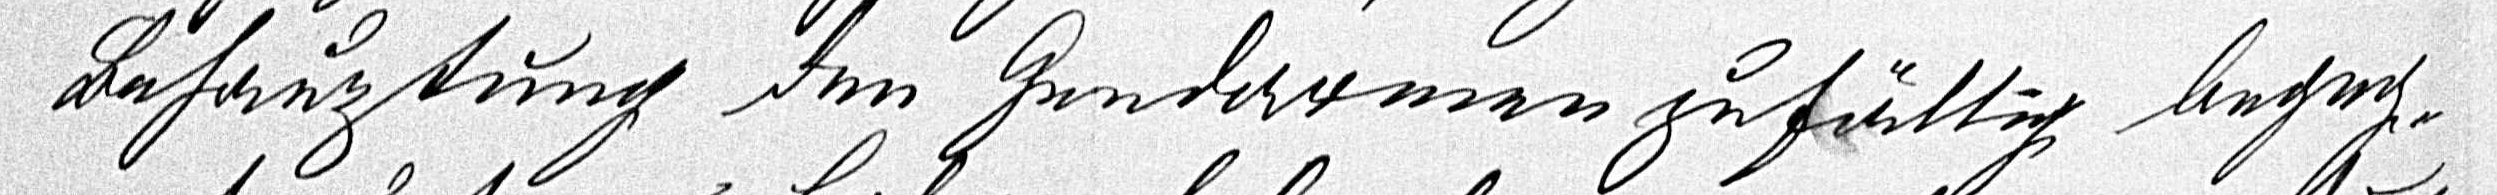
Behauptung den Gendarmen zufällig, begeg¬
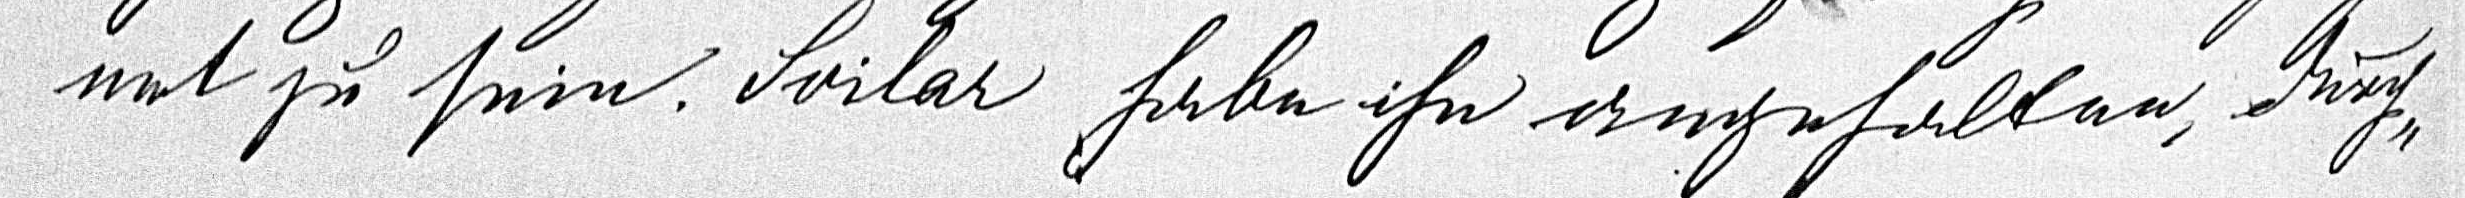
net zu sein. Svilar habe ihn angehalten, durch¬
